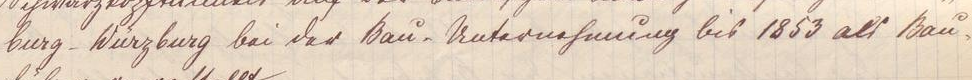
burg–Würzburg bei der Bau-Unternehmung bis 1853 als Bau-
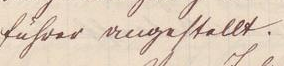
führer angestellt.
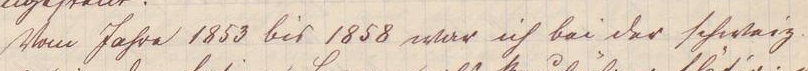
Vom Jahre 1853 bis 1858 war ich bei der schweiz.
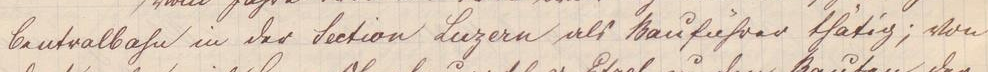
Centralbahn in der Section Luzern als Bauführer thätig; von
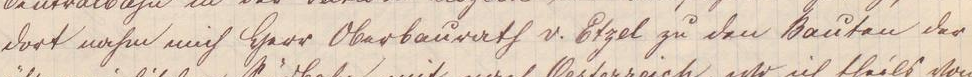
dort nahm mich Herr Oberbaurath v. Etzel zu den Bauten der
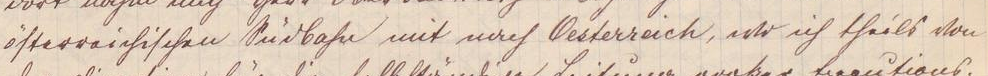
österreichischen Südbahn mit nach Oesterreich, wo ich theils von
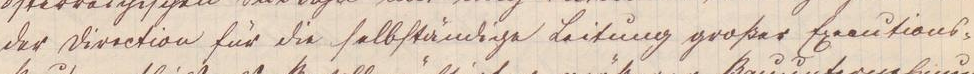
der Direction für die selbständige Leitung großer Executions-
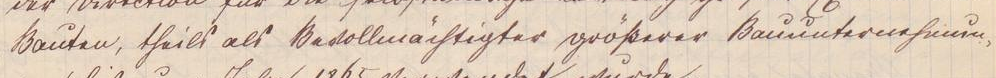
Bauten, theils als Bevollmächtigter größerer Bauunternehmun-
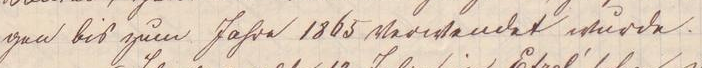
gen bis zum Jahre 1865 verwendet wurde.
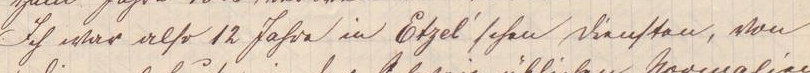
Ich war also 12 Jahre in Etzel 'schen Diensten, von
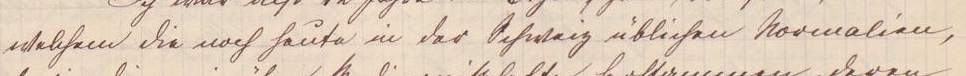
welchen die noch heute in der Schweiz üblichen Normalien,
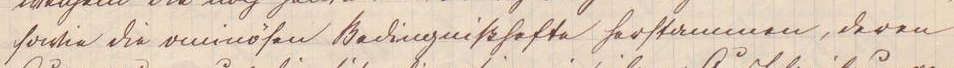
sowie die ominösen Bedingnißhefte herstammen, deren
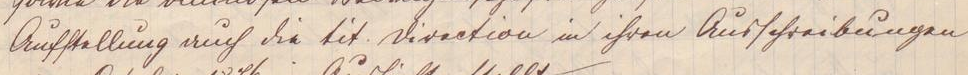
Aufstellung auch die tit. Direction in ihren Ausschreibungen
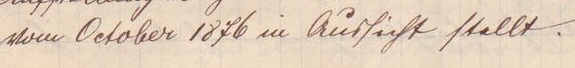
vom October 1876 in Aussicht stellt.
